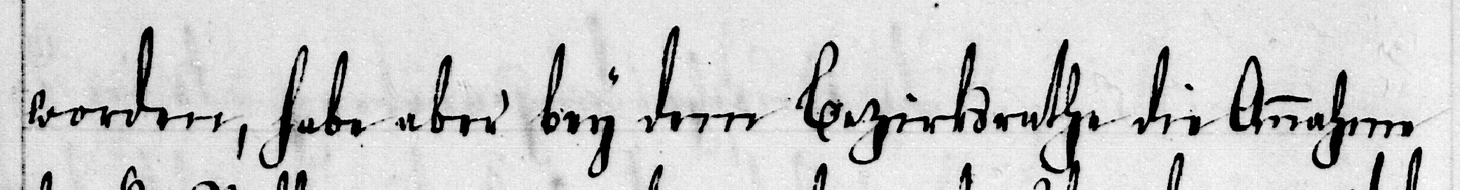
worden, habe aber bey dem Bezirksrathe die Annahme
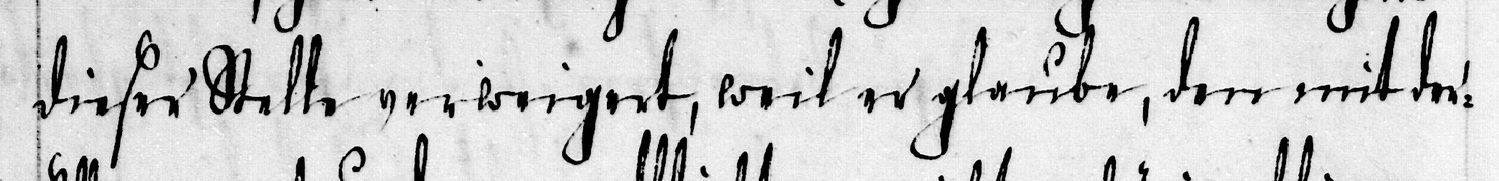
dieser Stelle verweigert, weil er glaube, den mit der¬
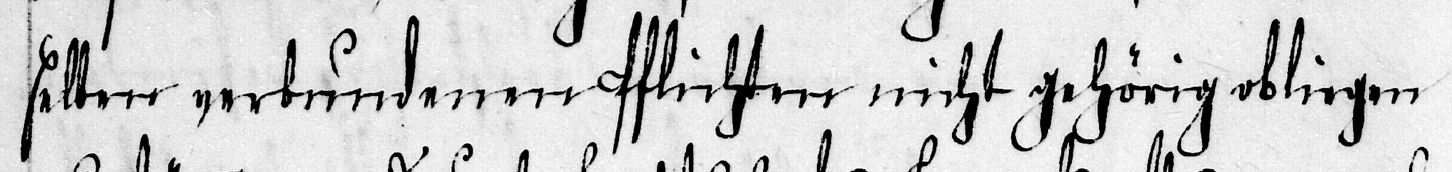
selben verbundenen Pflichten nicht gehörig obliegen
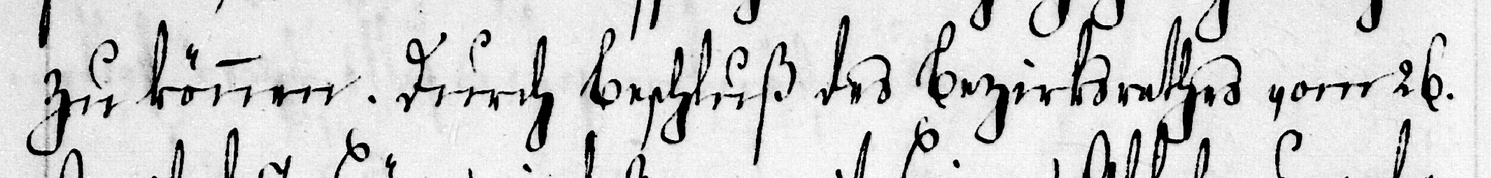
zu können. Durch Beschluß des Bezirksrathes vom 26.
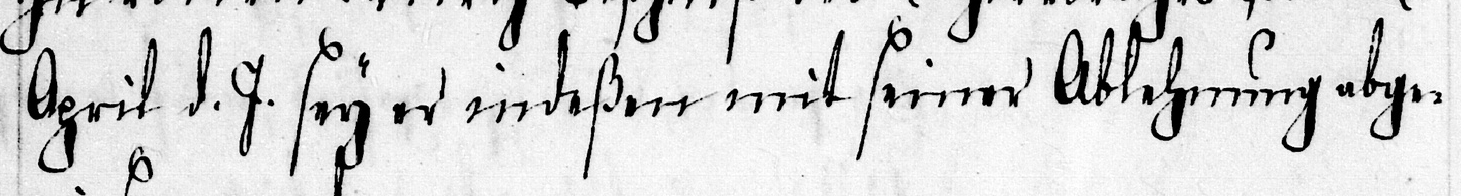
April d. J. sey er indeßen mit seiner Ablehnung abge¬
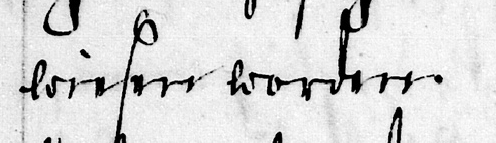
wiesen worden.
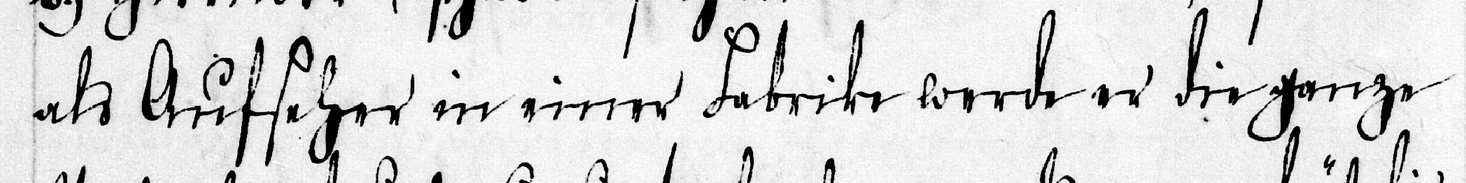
als Aufseher in einer Fabrik werde er die ganze
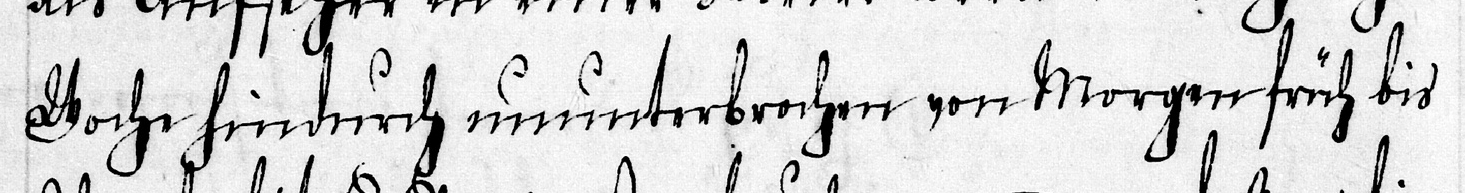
Woche hindurch ununterbrochen von Morgen früh bis
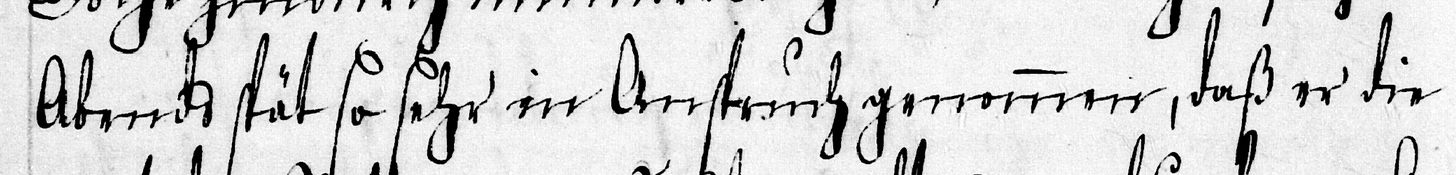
Abends spät so sehr in Anspruch genommen, daß er die
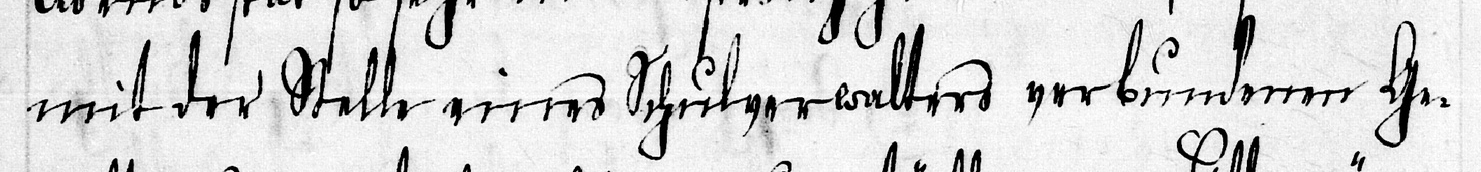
mit der Stelle eines Schulverwalters verbundenen Ge¬
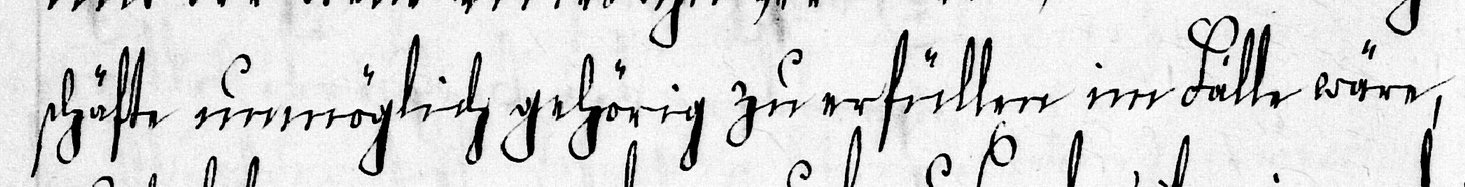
schäfte unmöglich gehörig zu erfüllen im Falle wäre,
